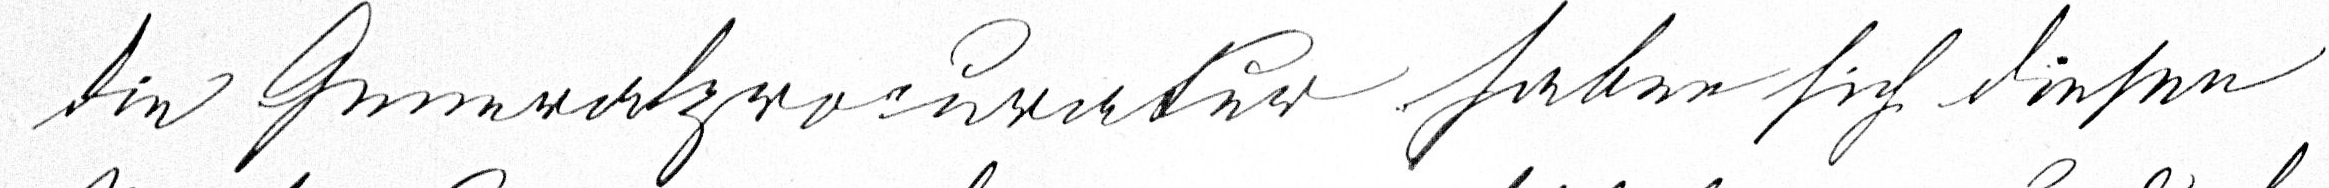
die Generalprocuratur haben sich diesen
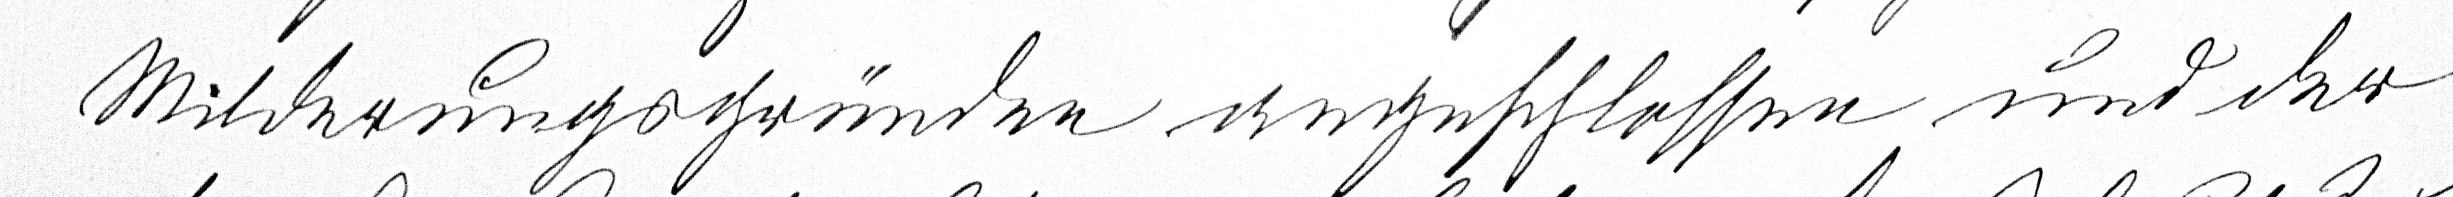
Milderungsgründen angeschlossen und der
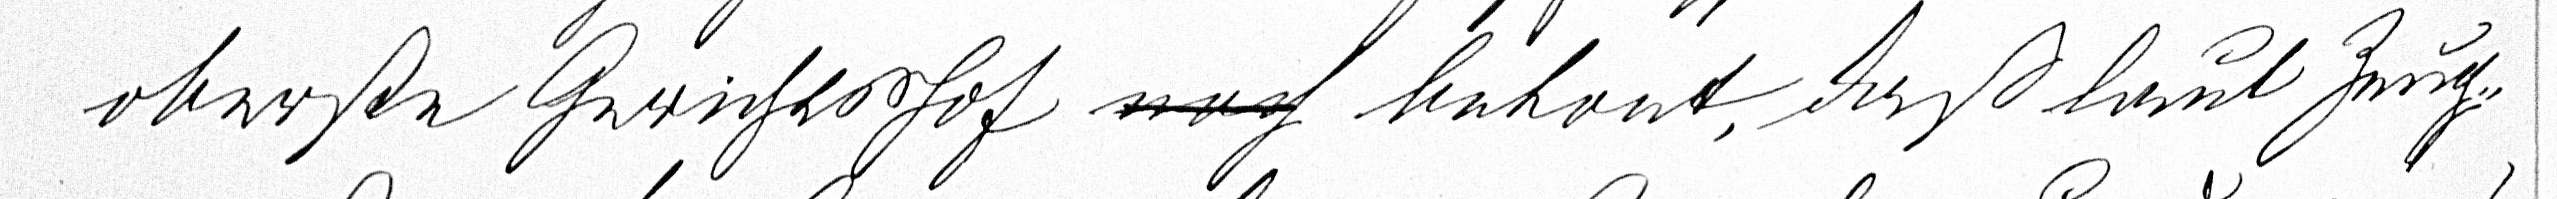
oberste Gerichtshof betont, daß laut Zeug¬
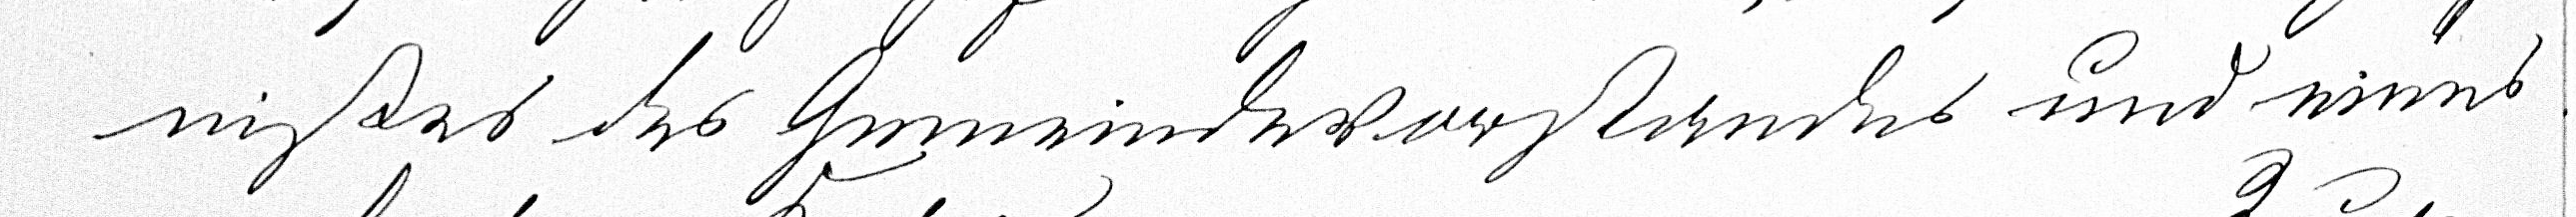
nißes des Gemeindevorstandes und eines
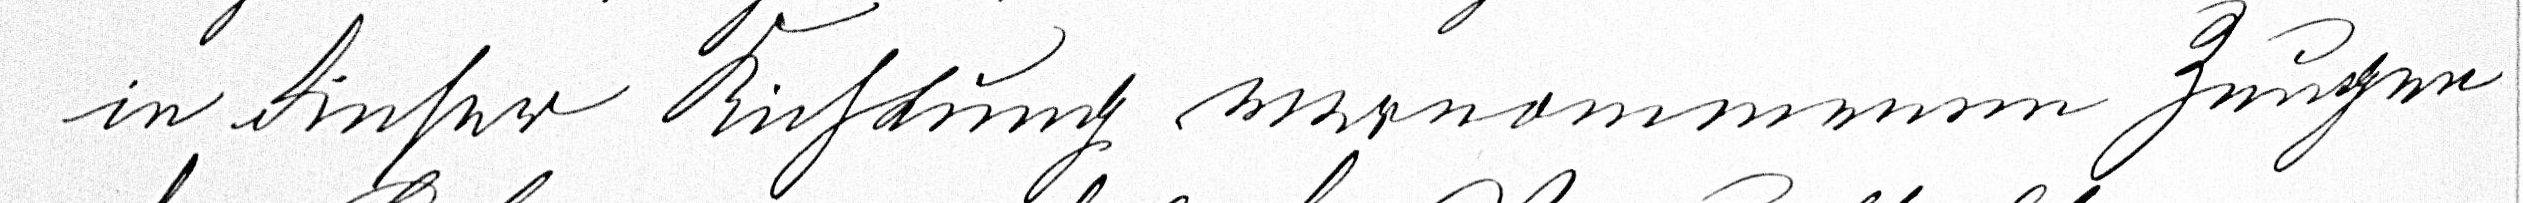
in dieser Richtung vernommenen Zungen
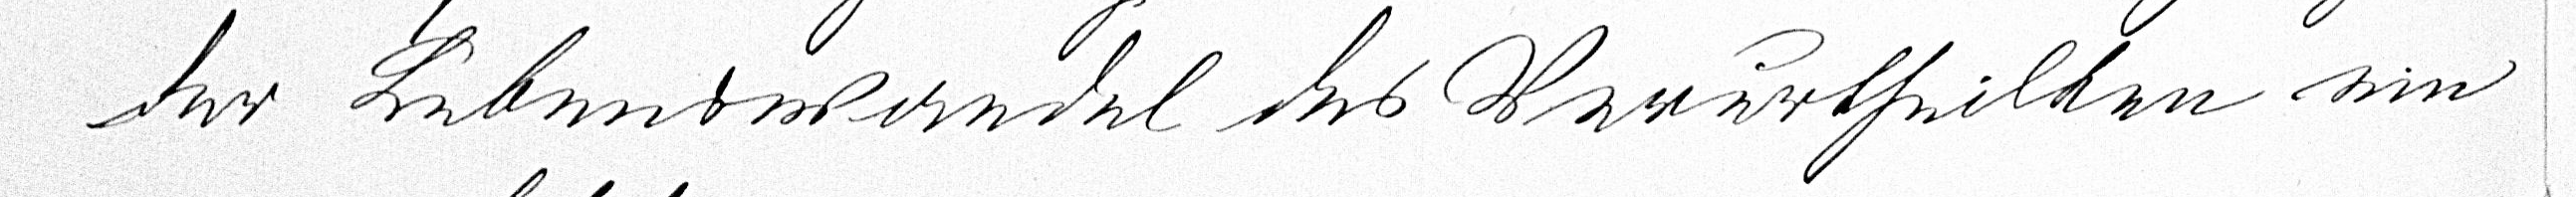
der Lebenswandel des Verurtheilten ein
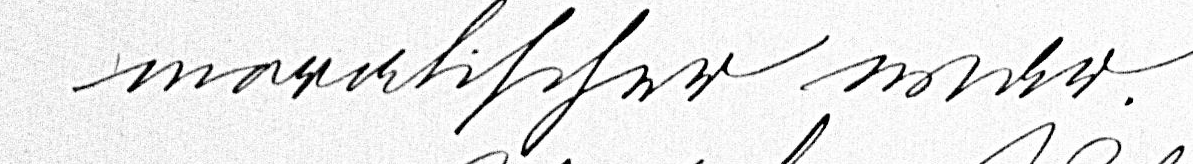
moralischer war.
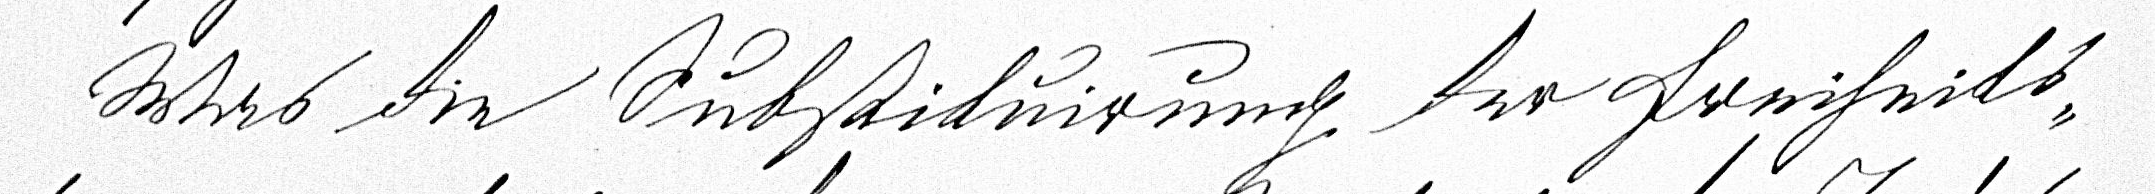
Was die Substituirung der Freiheits¬
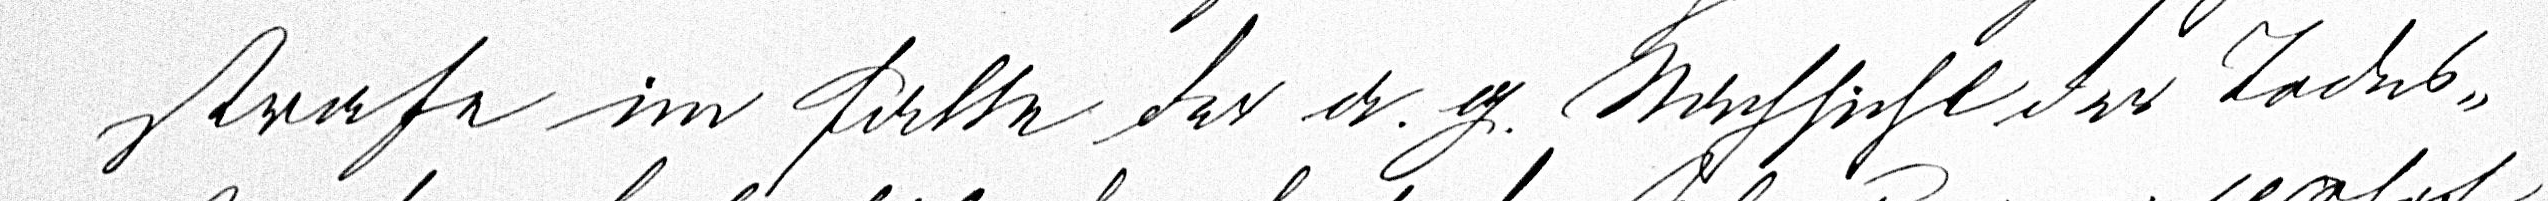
strafe im halle der a. g. Nachsicht der Todes¬
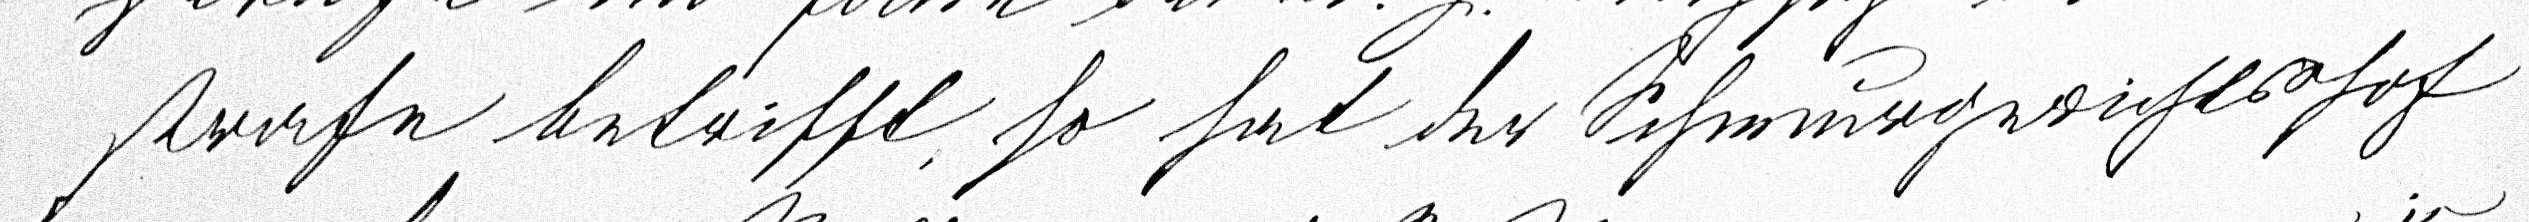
strafe betrifft, so hat der Schwurgerichtshof
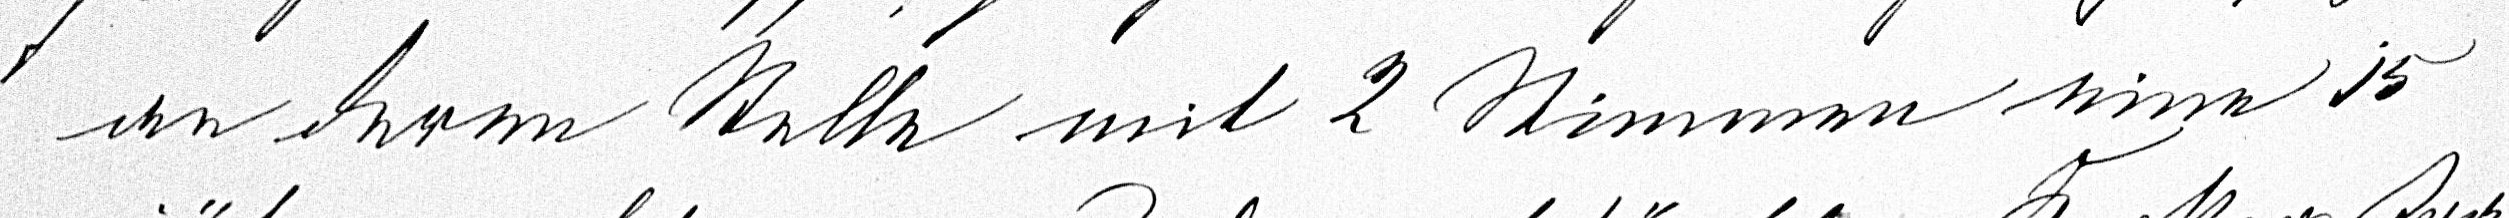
an deren Stelle mit 2 Stimmen eine 15
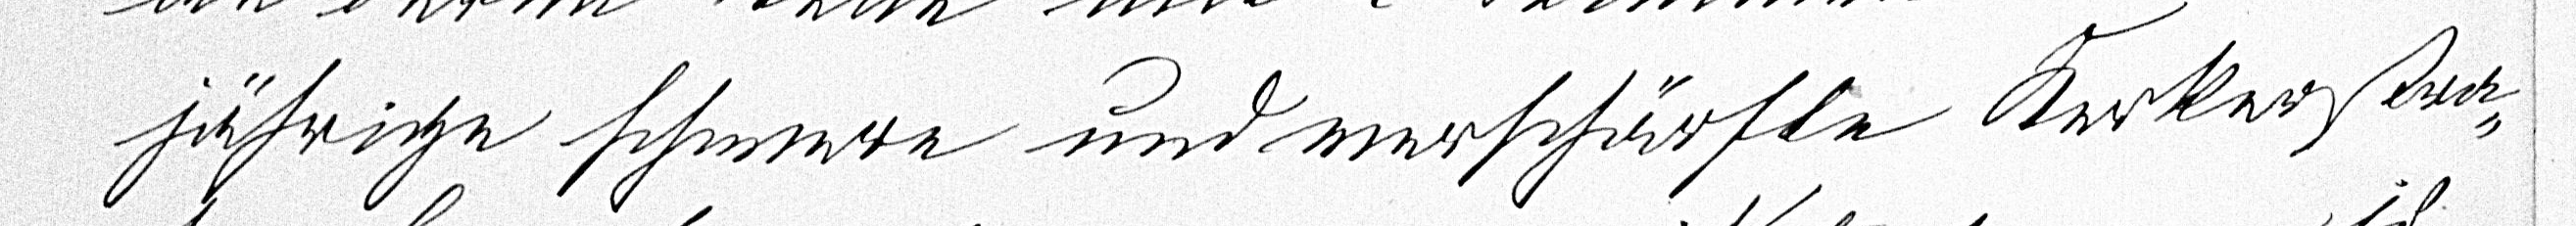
jährige schwere und verschärfte Kerkerstra¬
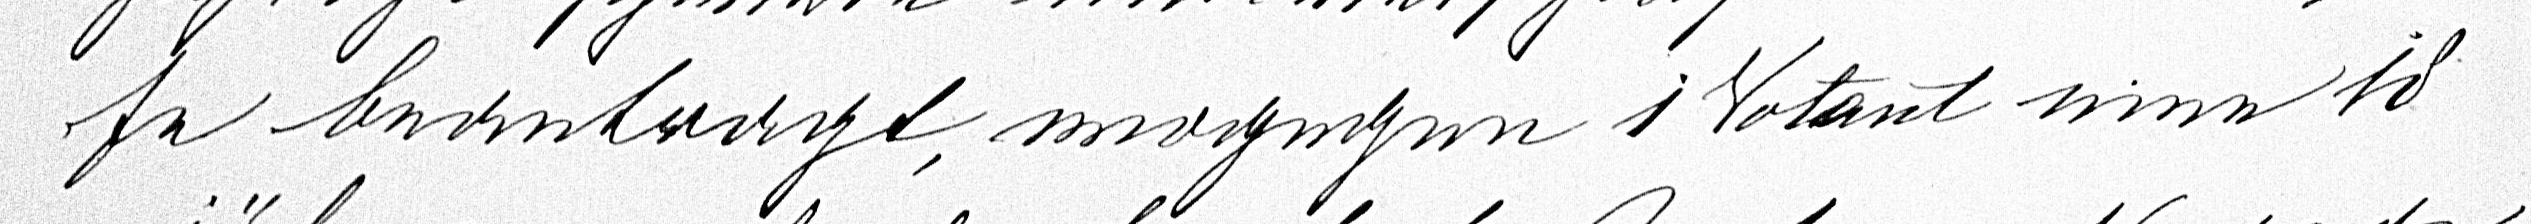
fe beantragt, wogegen 1 Votant eine 18
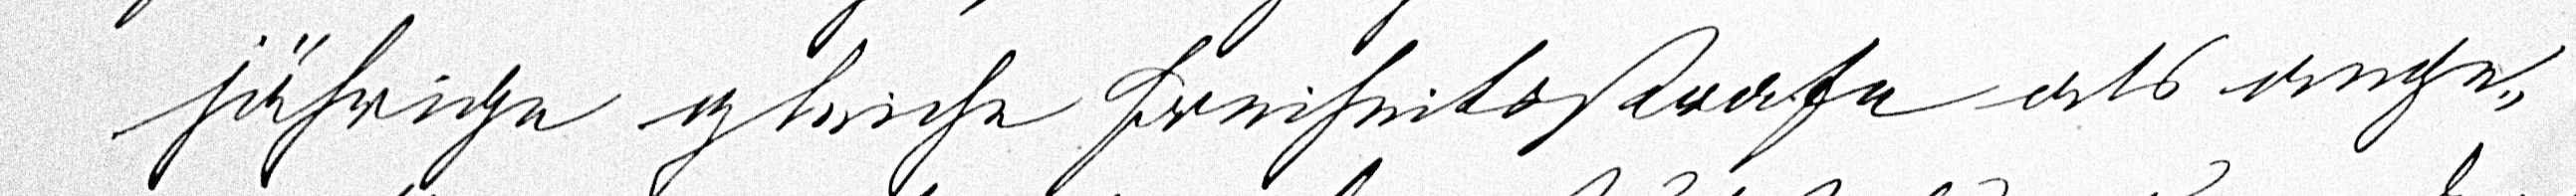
jährige gleiche Freiheitsstrafe als ange¬
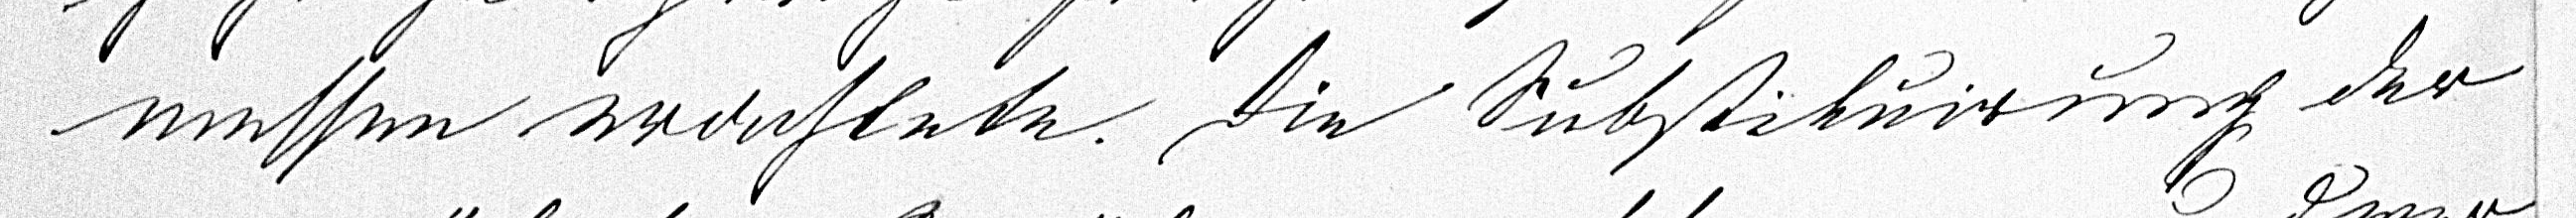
messen erachtete. Die Substituirung der
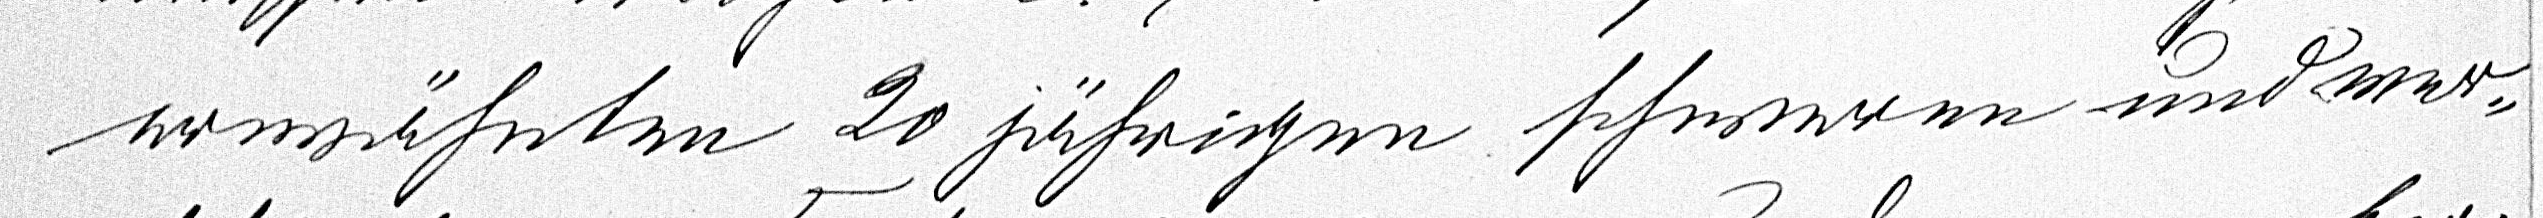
erwähnten 20 jährigen schweren und ver¬
